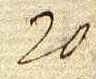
20
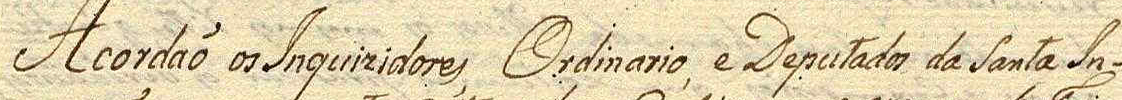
Acordaõ os Inquizidores, Ordinario, e Deputados da Santa In
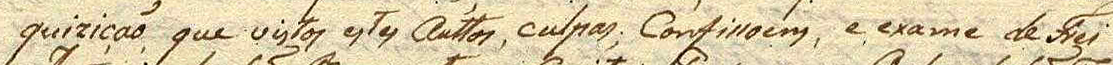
quiziçaõ, que vistos estes Auttos, culpas; Confissoens, e exame de Frei
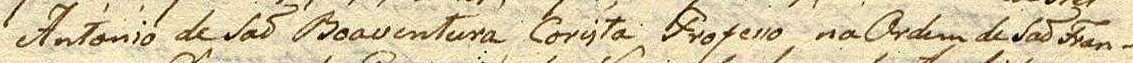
Antonio de Saõ Boaventura Corista Professo na Ordem de Saõ Fran
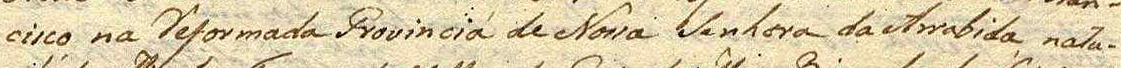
cisco na Reformada Provincia de Nossa Senhora da Arrabida, natu
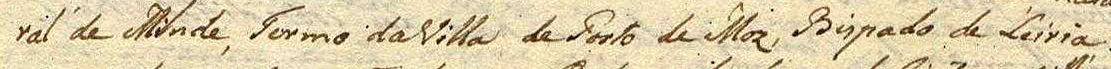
ral de Minde, Termo da Villa de Porto de Moz, Bispado de Leiria,
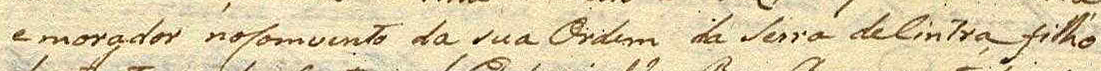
e morador no Comvento da sua Ordem da Serra de Cintra, filho
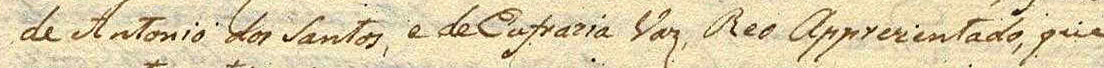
de Antonio dos Santos, e de Eufrazia Vaz, Reo Apprezentado, que
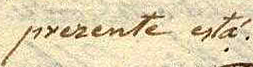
prezente está.
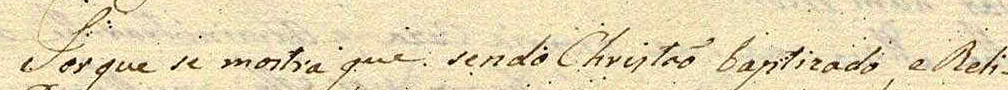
Porque se mostra que sendo Christaõ baptizado, e Reli
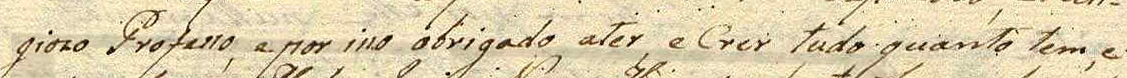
giozo Professo, e por isso obrigado a ter, e Crer tudo quanto tem, e
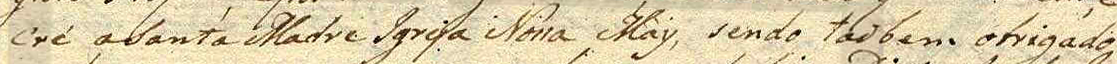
cré a Santa Madre Igreja Nossa May, sendo taõbem obrigado
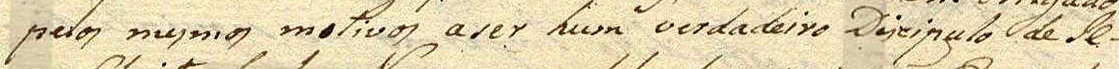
pelos mesmos motivos a ser hum verdadeiro Discipulo de Ie
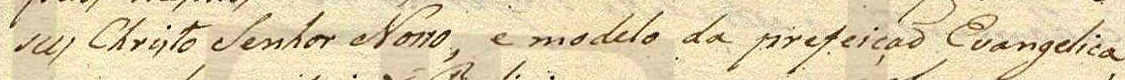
sus Christo Senhor Nosso, e modelo da prefeiçaõ Evangelica,
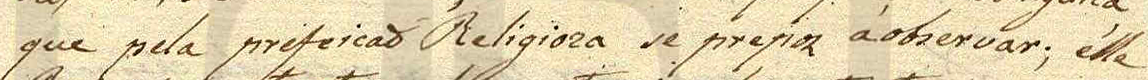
que pela prefeiçaõ Religioza se prepoz a observar; elle
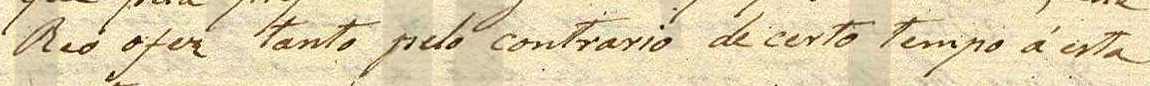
Reo o fez tanto pelo contrario de certo tempo á esta
